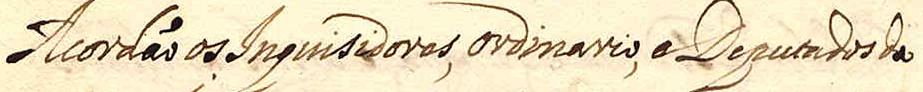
Acordão os Inquisidores, ordinario, e Deputados da
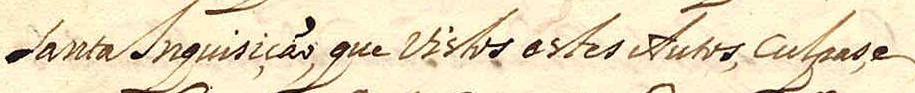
Santa Inquisição, que vistos estes Autos, culpas, e
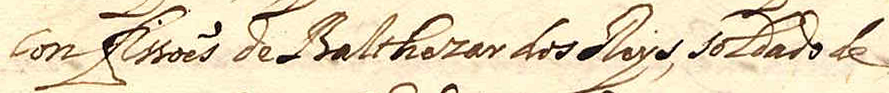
confissões de Balthezar dos Reys, soldado de
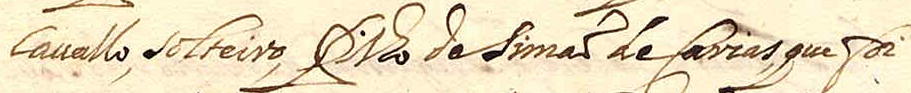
Cauallo, solteiro, filho de Simaõ de Carias, que foi
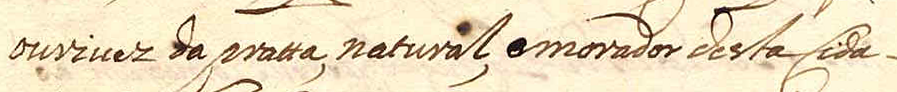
ourivez da pratta, natural, e morador desta Cida
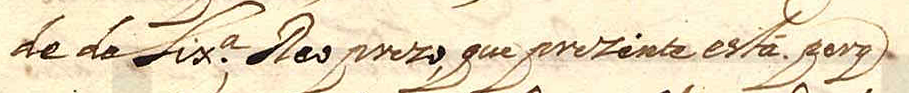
de de Lix.a, Reo prezo, que prezente está porq̄
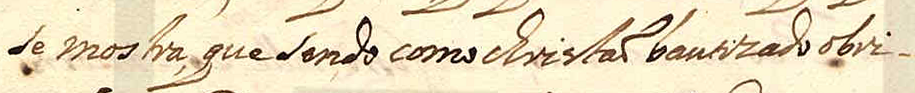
se mostra, que sendo como christaõ bautizado obri
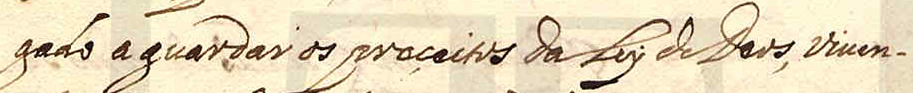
gado a guardar os preceitos da Ley de Deos, viuen
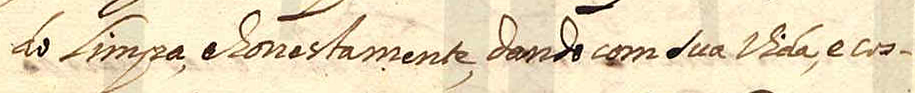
do Limpa, e honestamente, dando com sua Vida, e cos
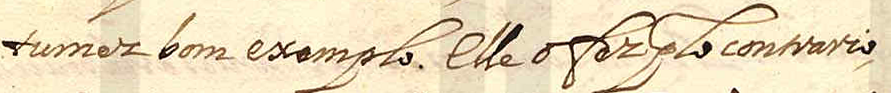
tumez bom exemplo. Elle o fez plo contrario,
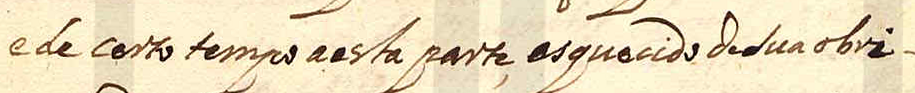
e de certo tempo a esta parte, esquecido de sua obri
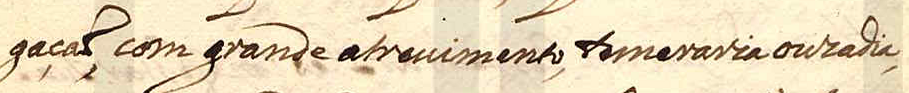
gaçaõ, com grande atrevimento, temeraria ouzadia,
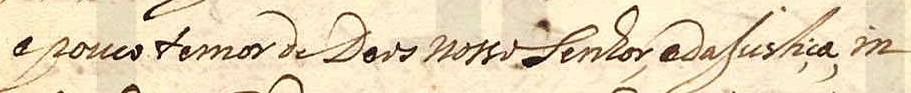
e pouco temor de Deos nosso Senhor e da Justiça, in
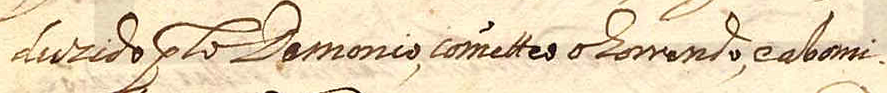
duzido plo Demonio, com̄etteo o horrendo, e abomi
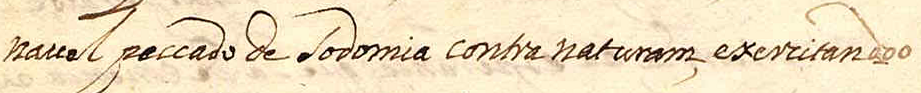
navel peccado de sodomia contra naturam, exercitando o
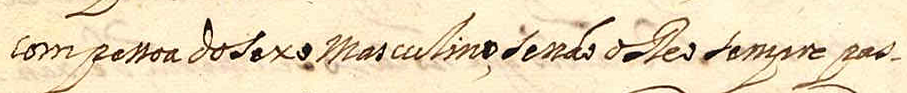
com pessoa do sexo masculino, sendo o Reo sempre pas
